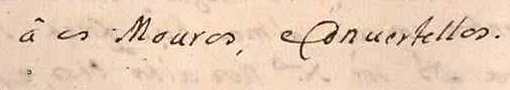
âos Mouros, e Conuertellos.
